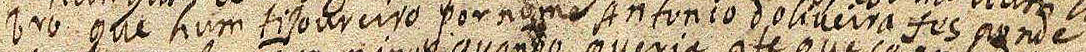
vro que hum tizoureiro por nome Antonio doliueira fes aonde
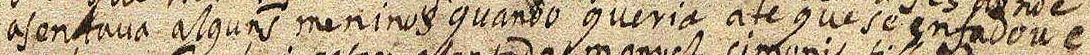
asentaua alguns meninos quando queria ate que se enfadou e
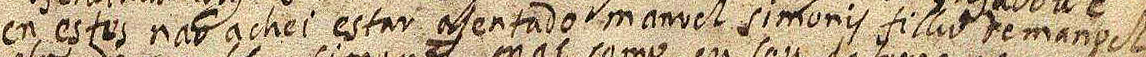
en estes naõ achei estar asentado manoel simonis filho de manoel
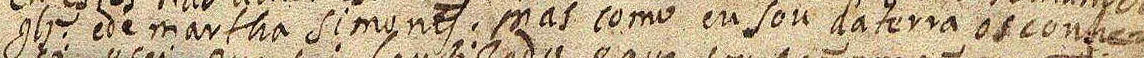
gls̄. e de martha simonis. mas como eu sou da terra os conhe
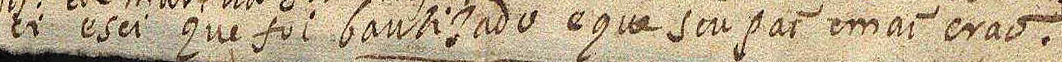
ci e sei que foi bautizado e que seu paĩ e maĩ eraõ.
